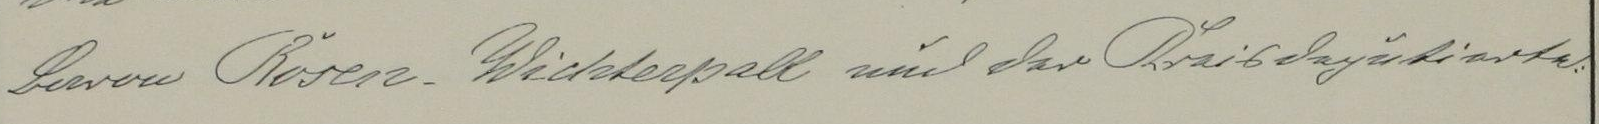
Baron Rosen-Wichterpall und der Kreisdeputierte
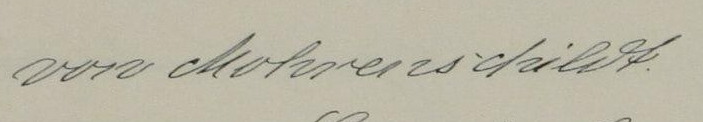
von Mohrenschildt.
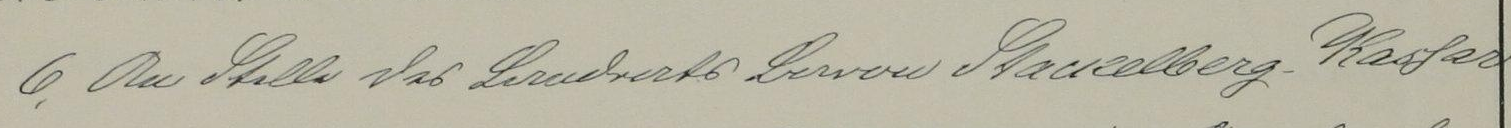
6. An Stelle des Landrats Baron Stackelberg-Kassar
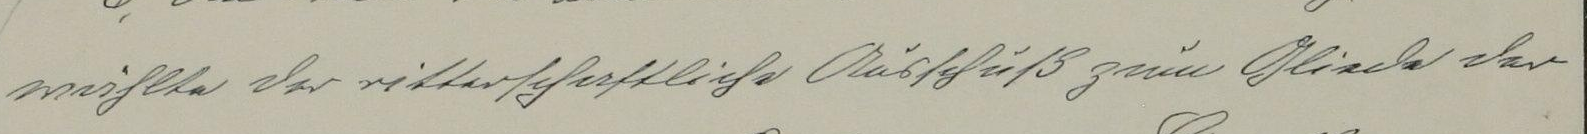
wählte der ritterschaftliche Ausschuß zum Gliede der
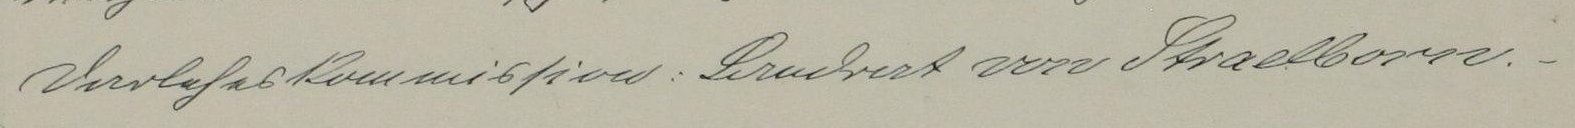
Darlehnskommission Landrat von Straelborn.
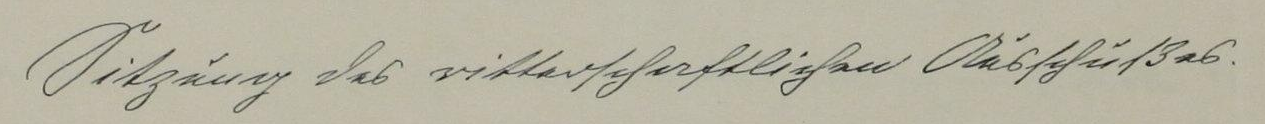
Sitzung des ritterschaftlichen Ausschußes.
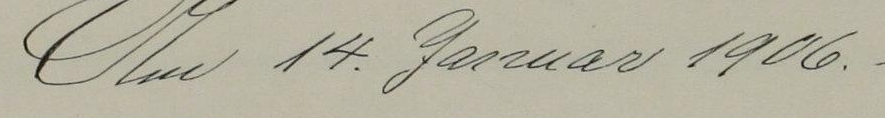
Am 14. Januar 1906.
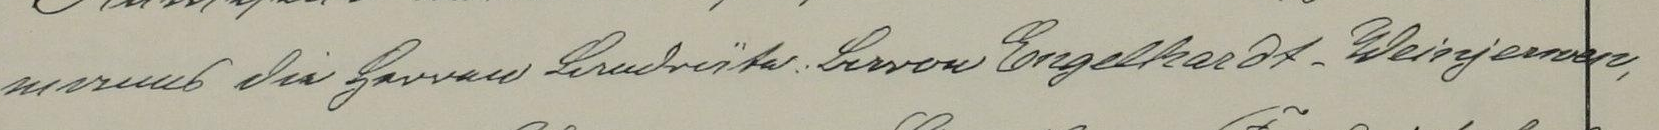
manns die Herren Landräte: Baron Engelhardt-Weinjerwen,
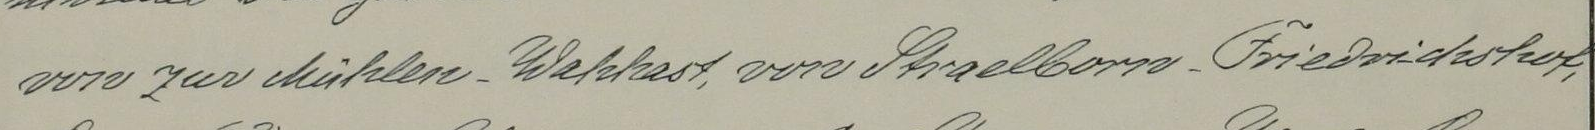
von zur Mühlen-Wahhast, von Straelborn-Friedrichshof,
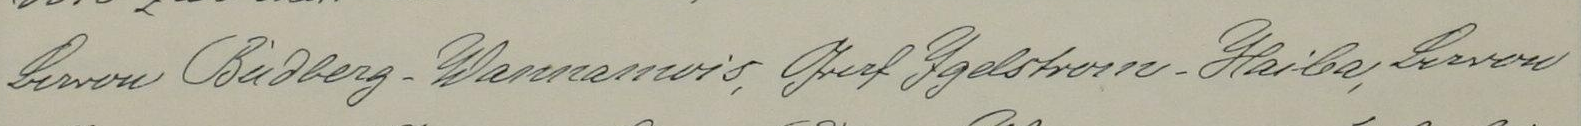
Baron Budberg-Wannamois, Graf Igelstrom-Haiba, Baron
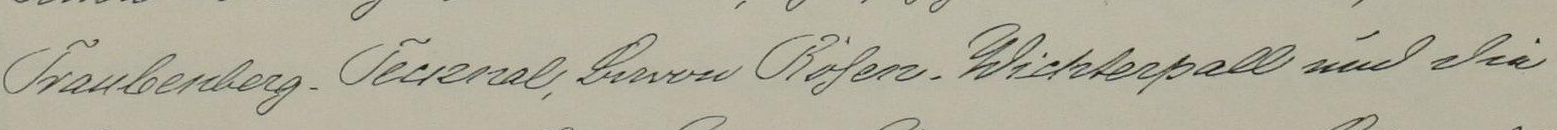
Traubenberg-Tecknal, Baron Rosen-Wichterpall und die
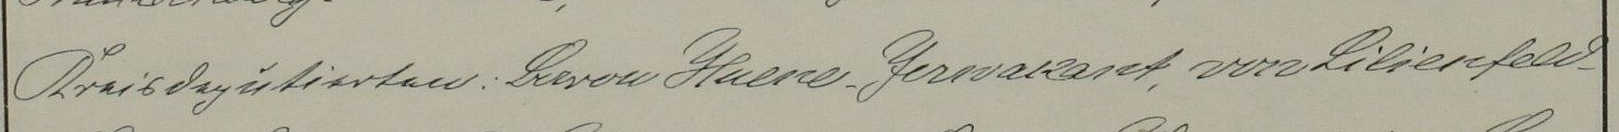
Kreisdeputierten: Baron Huene-Jerwakant, von Lilienfeld-
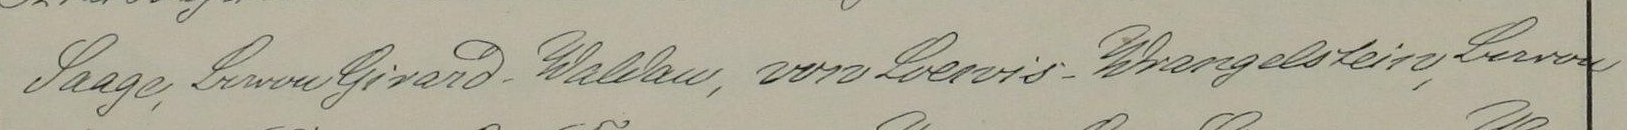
Saage, Baron Girard-Waldau, von Loewis-Wrangelstein, Baron
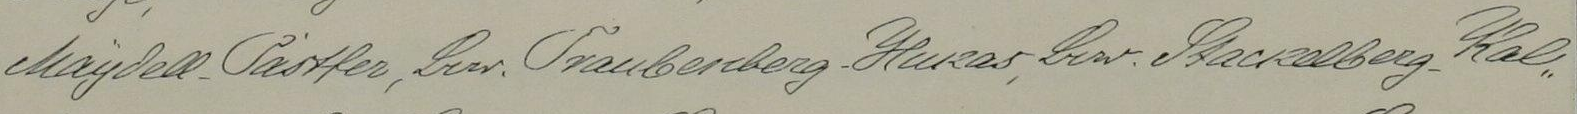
Maydell-Pastfer, Bar. Traubenberg-Hukas, Bar. Stackelberg-Kal-
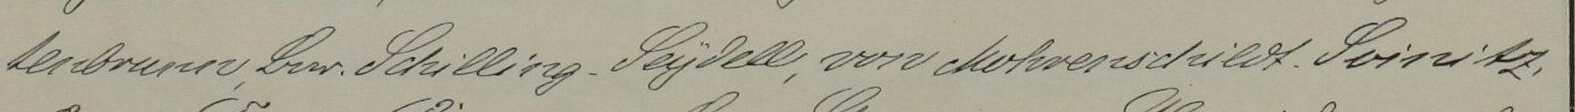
tenbrunn, Bar. Schilling-Seydell, von Mohrenschildt-Soinitz,
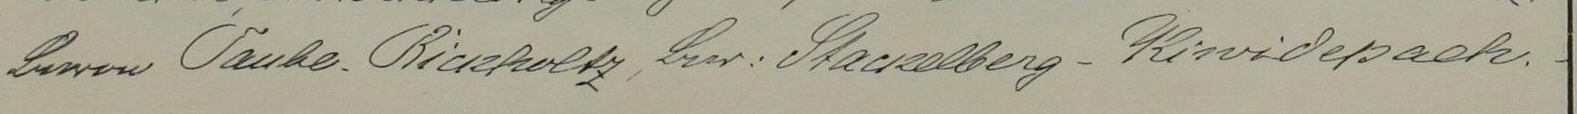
Baron Taube-Rickholtz, Bar. Stackelberg-Kiwidepaeh.
